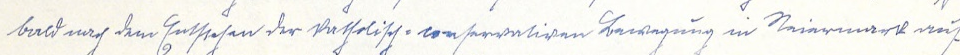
bald nach dem Entstehen der katholisch-conservativen Bewegung in Steiermark auf
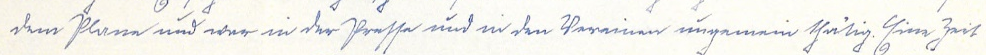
dem Plane und war in der Presse und in den Vereinen ungemein thätig. Eine Zeit
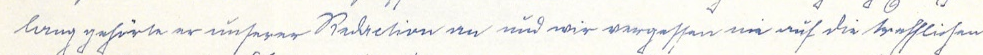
lang gehörte er unserer Redaction an und wir vergessen nie auf die trefflichen
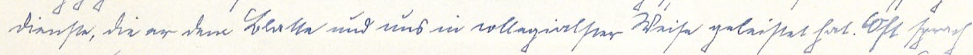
Dienste, die er dem Blatte und uns in XXXialster Weise geleistet hat. Oft sprach
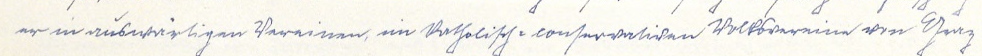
er in auswärtigen Vereinen, im katholisch-conservativen Volksvereinen von Graz
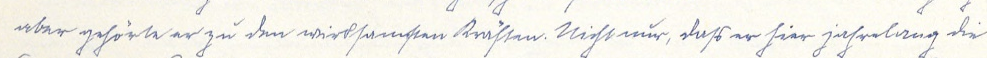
oder gehörte er zu den wirksamsten Kräften. Nicht nur, dass er hier jahrelang die
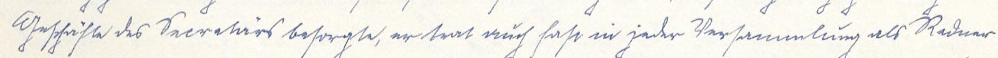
Geschäfte des Secretärs besorgte, er trat auch fast in jeder Versammlung als Redner
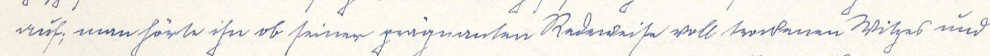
auf; man hörte ihn ob seiner prägnanten Redeweise voll XXX Witzes und
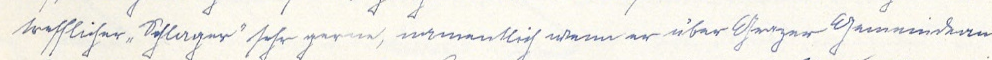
trefflicher "Schlager" sehr gerne, vornemlich wann er über Grazer Gemeindean-
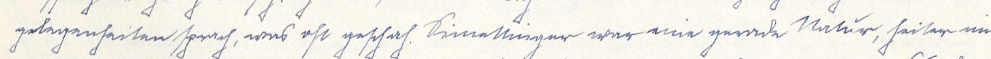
gelegenheitn sprach, was oft geschah. Simettinger war eine gerade Natur, heiter in
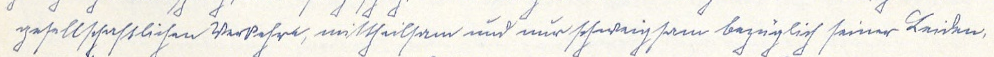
gesellschaftlichen Verkehr, mittheilsam und nur schweigsam bezüglich seiner Leiden,
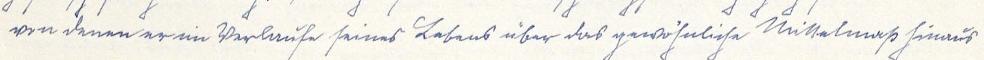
von denen er im Verlaufe seines Lebens über das gewähnliche Mittelmaß hinaus
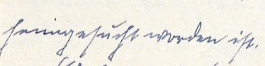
heimgesucht worden ist.
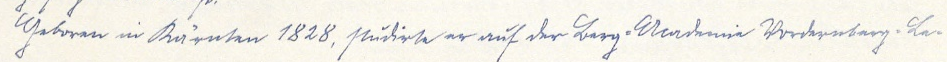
Geboren in Kärnten 1828, studierte er auf der Berg-Academie Vordernberg-Le-
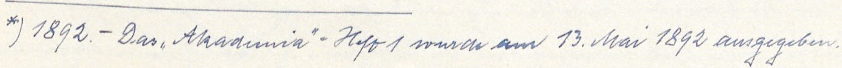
*) 1892. - Das "Akademia"-Heft 1 wurde am 13. Mail 1892 ausgegeben.
